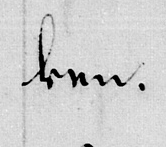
ken.
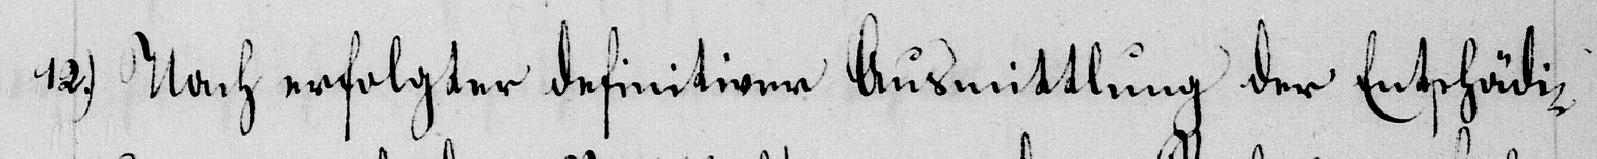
12.) Nach erfolgter definitiver Ausmittlung der Entschädi¬
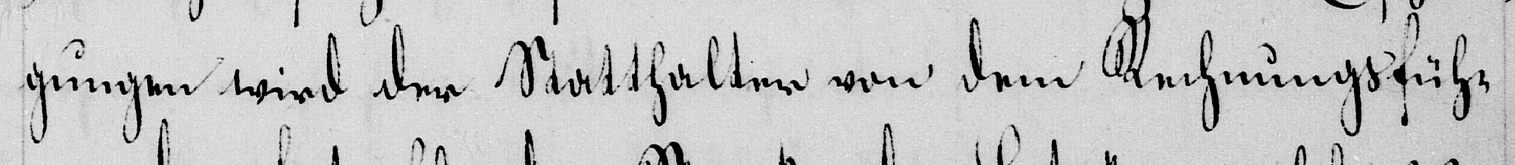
gungen wird der Statthalter von dem Rechungsfüh¬
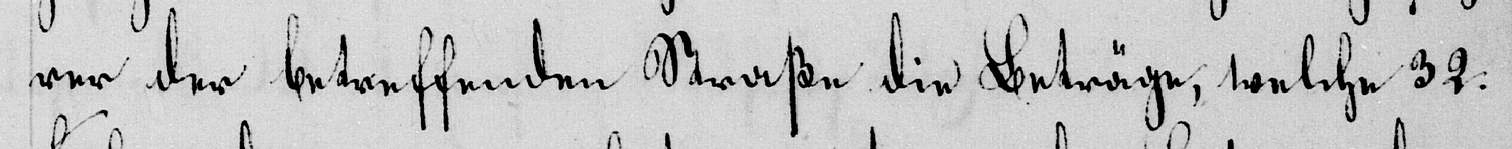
rer der betreffenden Straße die Beträge, welche 32.
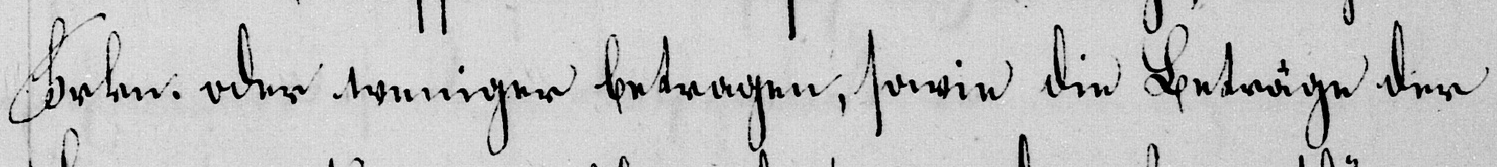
Frkn. oder weniger betragen, sowie die Beträge der
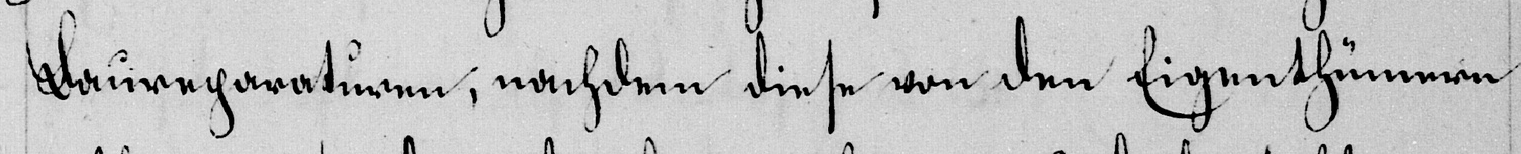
Baureparaturen, nachdem diese von den Eigenthümern
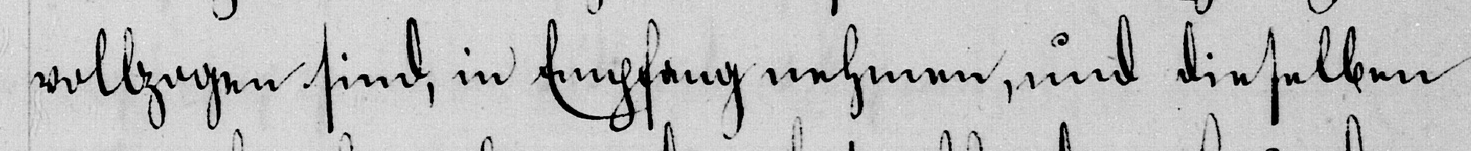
vollzogen sind, in Empfang nehmen, und dieselben
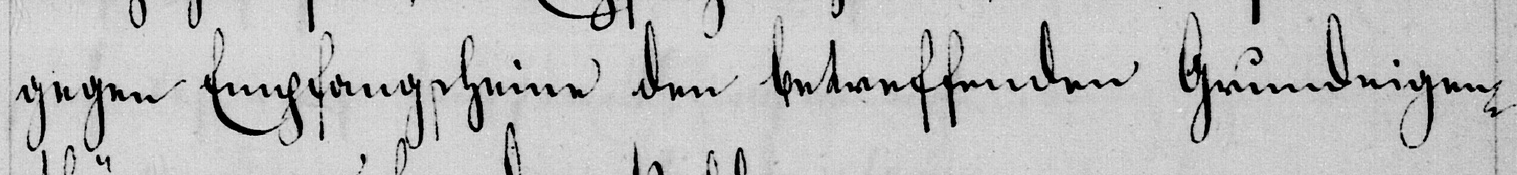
gegen Empfangsscheine den betreffenden Grundeigen¬
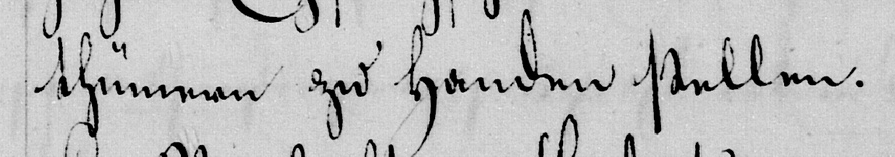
thümern zu Handen stellen.
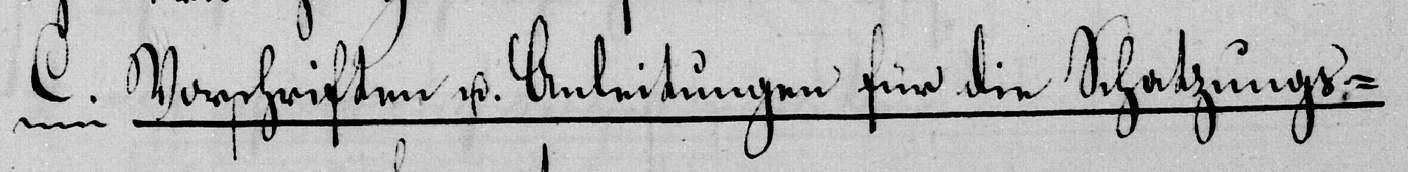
C. Vorschriften u. Anleitungen für die Schatzungs-E¬
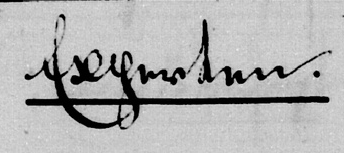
xperten.
